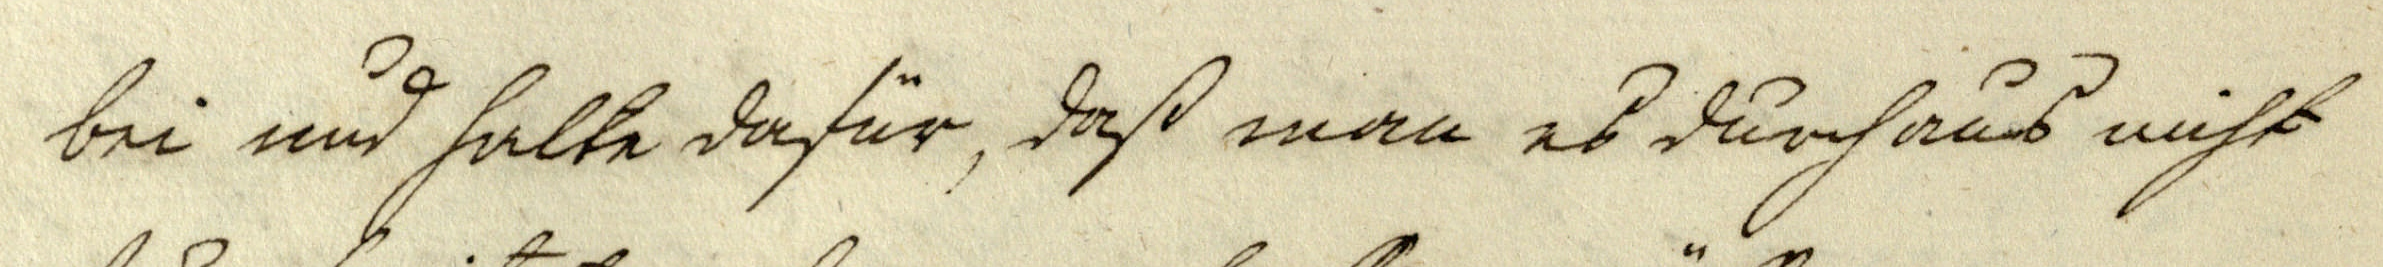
bei und halte dafür, daß man es durchaus nicht
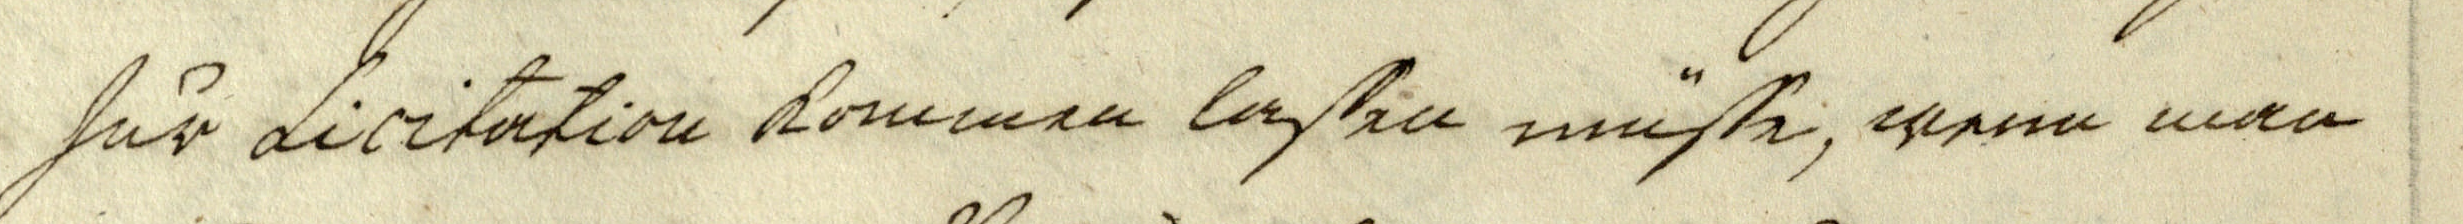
zur Licitation kommen lassen müsse, wenn man
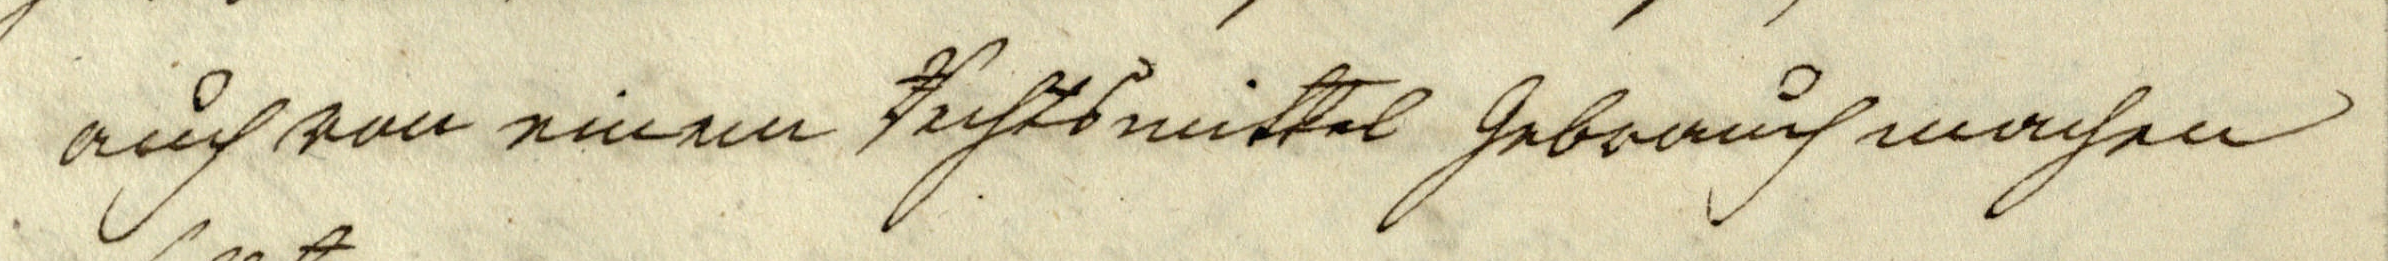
auch von einem Rechtsmittel Gebrauch machen
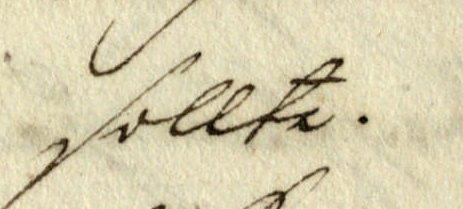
sollte.
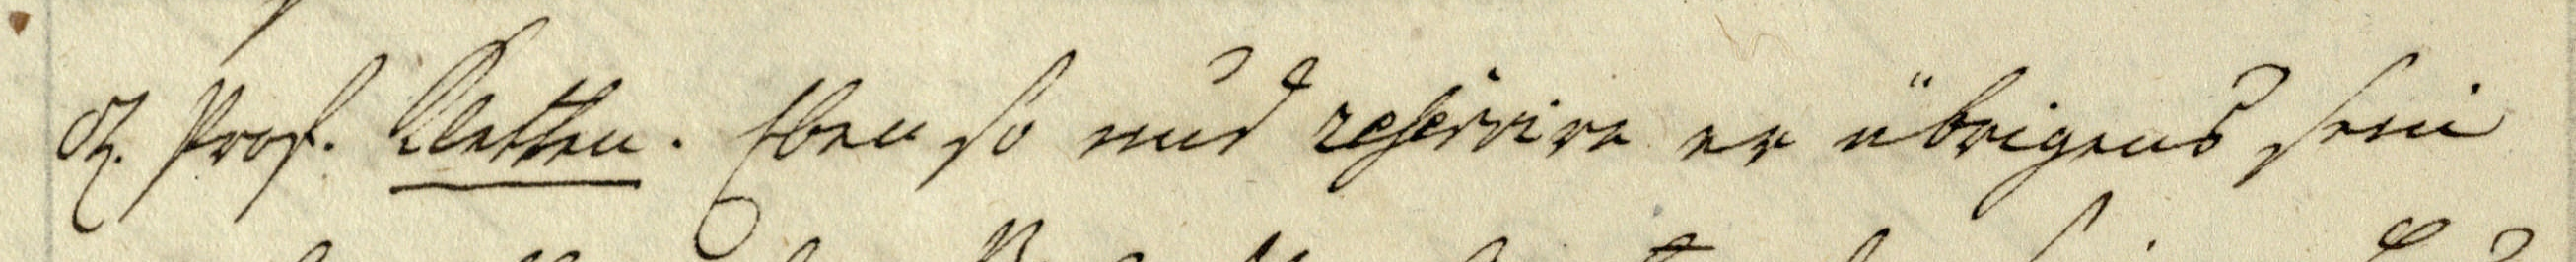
dh. Prof. Kletten. Eben so und reservire er übrigens sein
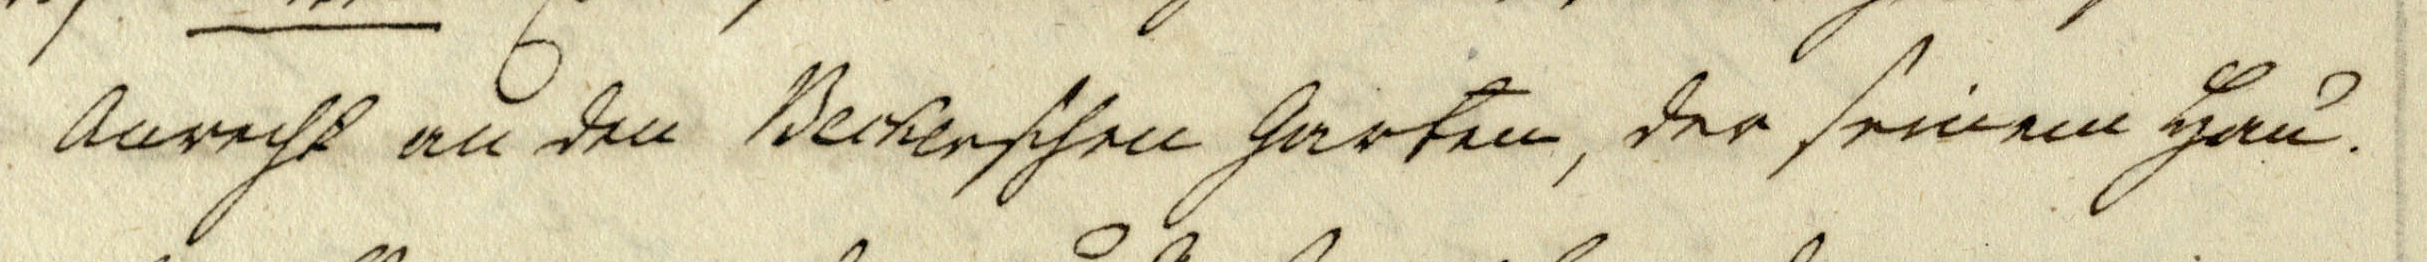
Anrecht an den Beckerschen Garten, der seinem Hau¬
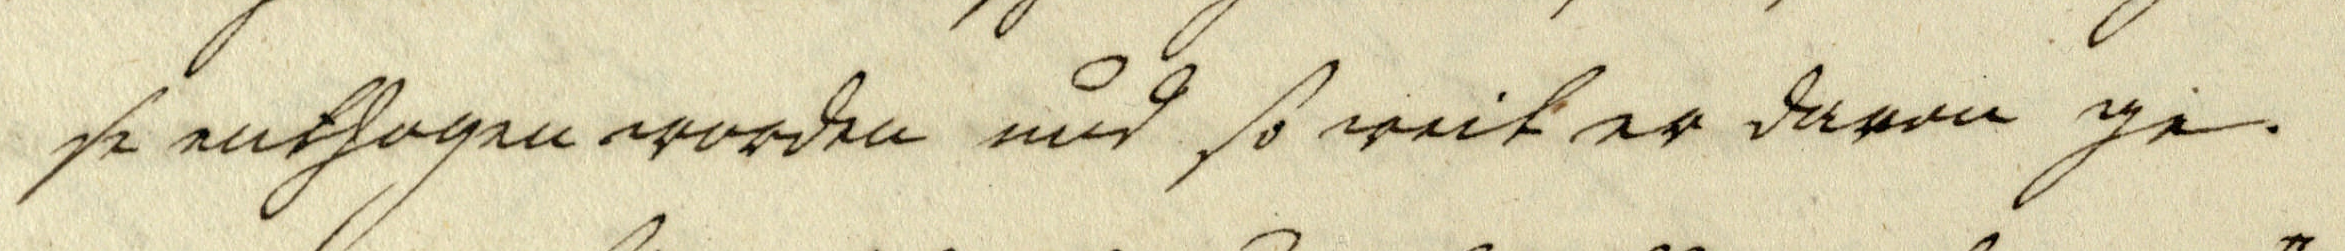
se entzogen worden und so weit er davon ge¬
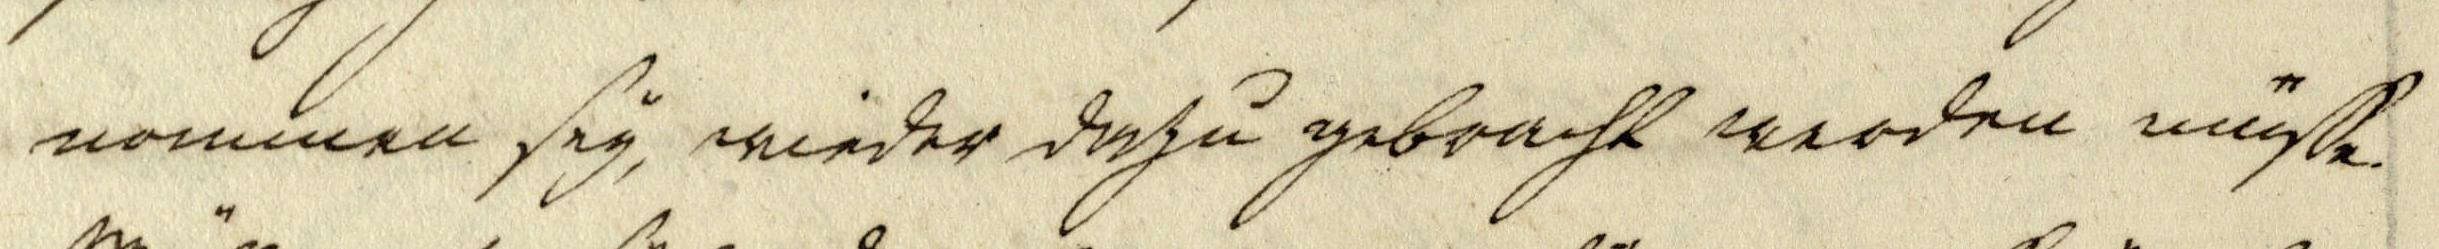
nommen seÿ, wieder dazu gebracht werden müsse.
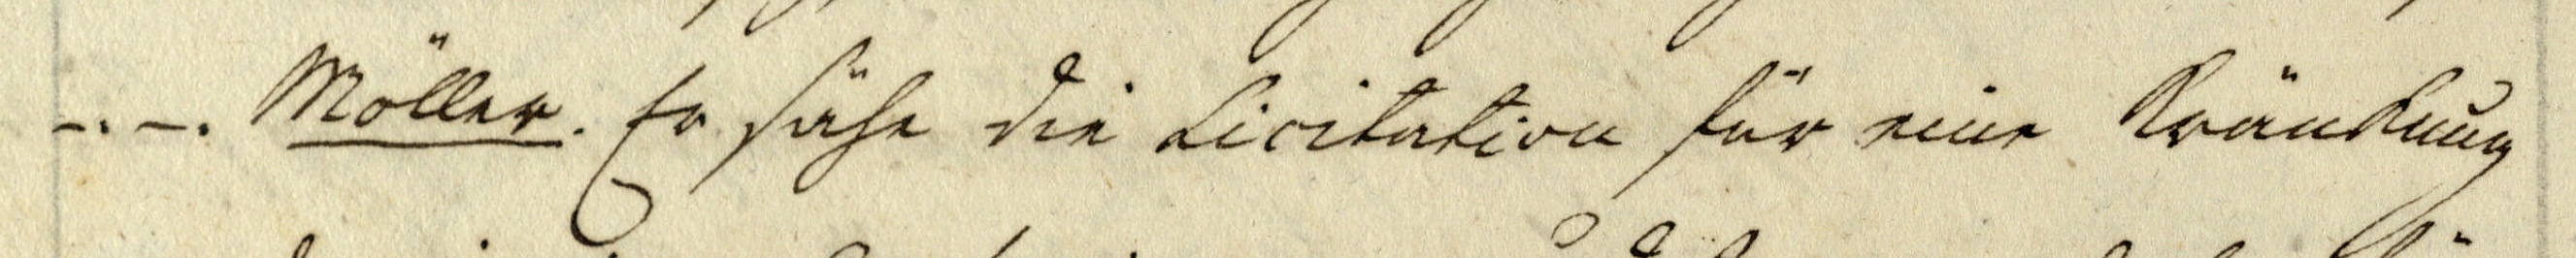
Möller. Er sähe die Licitation für eine Kränkung
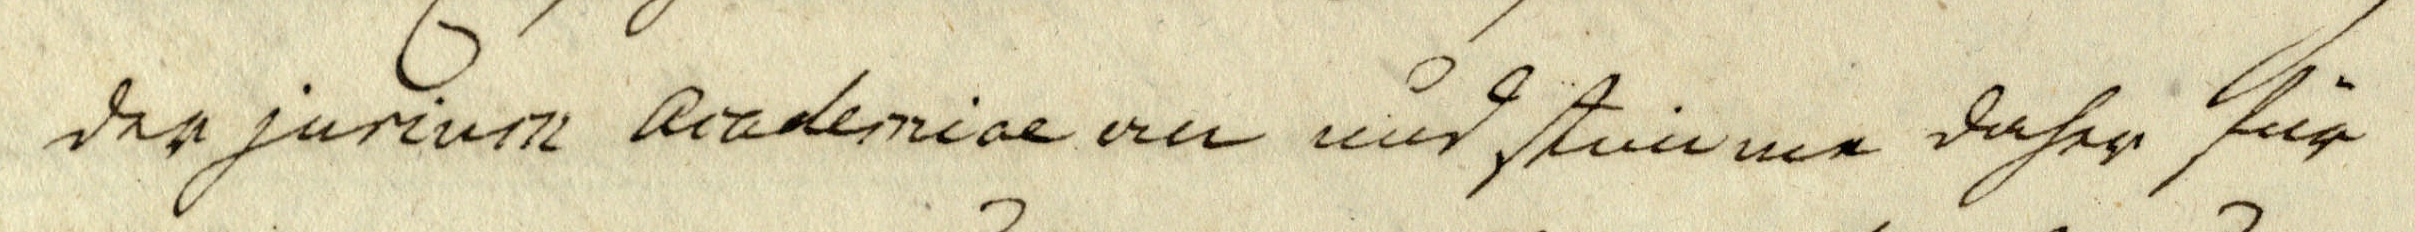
der jurium Academiae an und stimme daher für
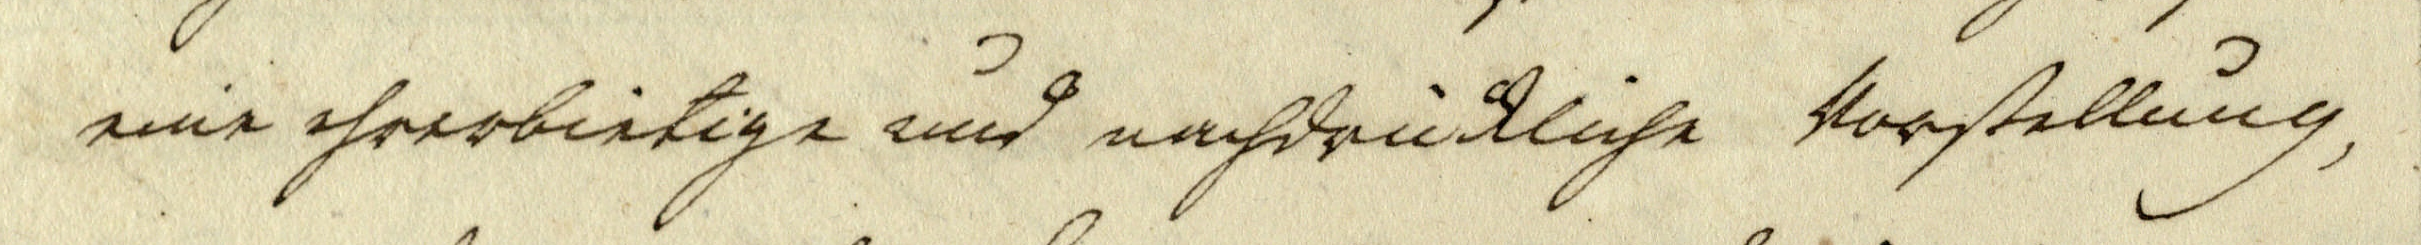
eine ehrerbietige und nachdrückliche Vorstellung,
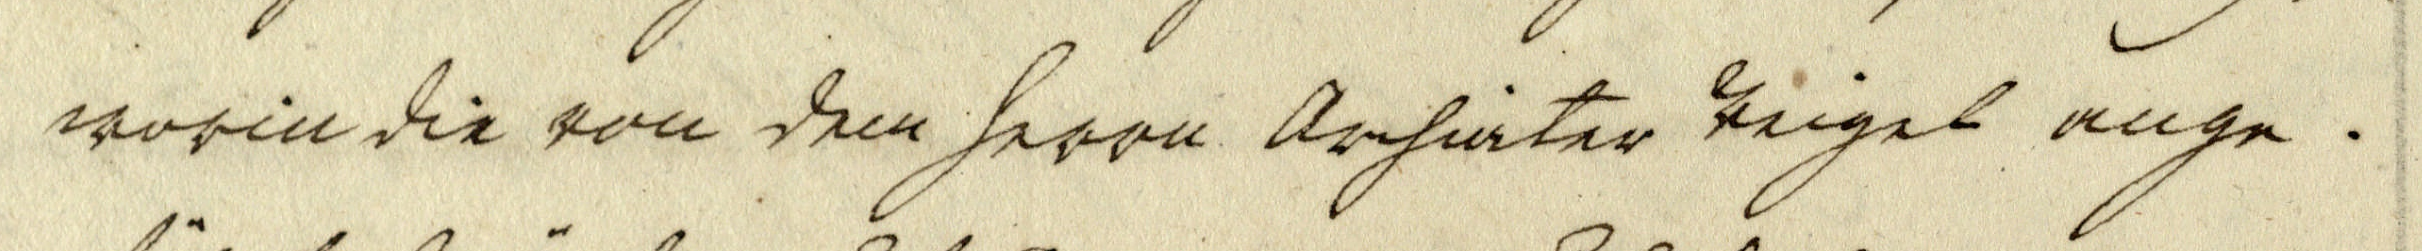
worin die von dem Herrn Archiater Weigel ange¬
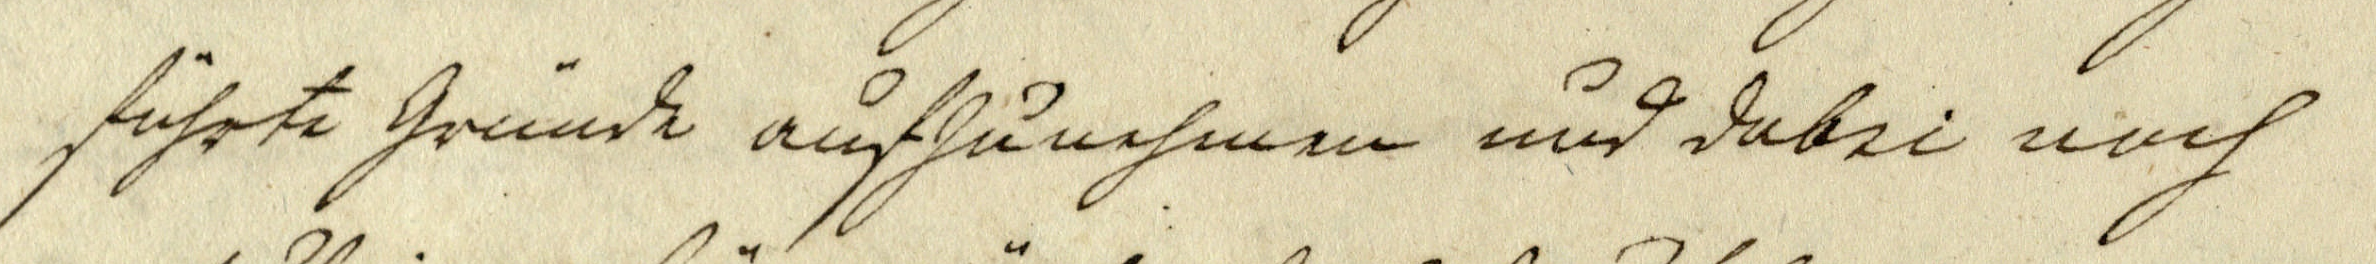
führte Gründe aufzunehmen und dabei noch
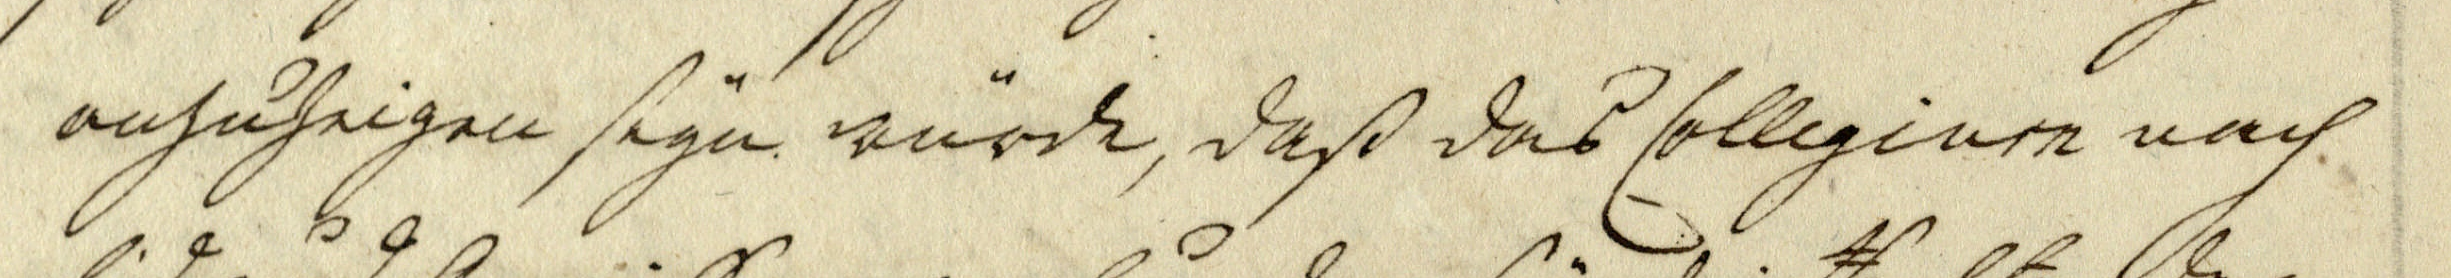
anzuzeigen seÿn würde, daß das Collegium nach
